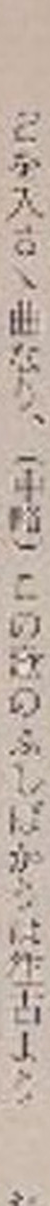どを入るゝ曲なり、(中略)この歌のふしばかりは往古より
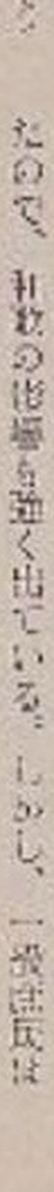たので、和歌の影響も強く出ている。しかし、一般庶民は
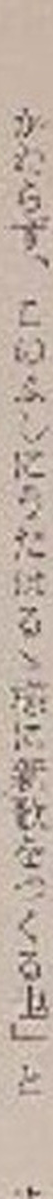かわらず、このふしにうたはるゝ様に新歌をつくる也」と
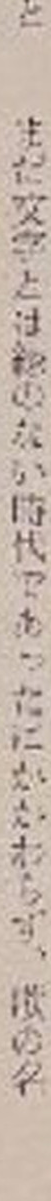まだ文学とは縁のない時代であったにかかわらず、歌の名
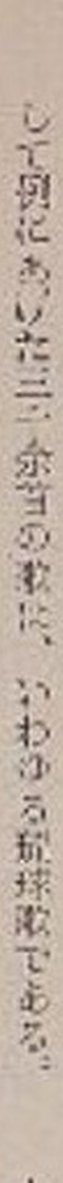して例にあげた三十余首の歌は、いわゆる琉球歌である。
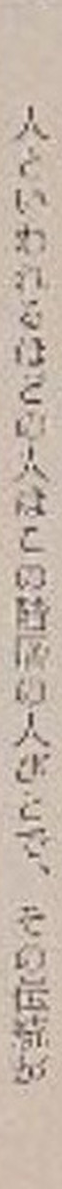人といわれるほどの人はこの階級の人びとで、その伝統が
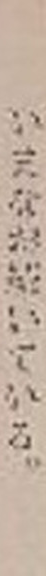いまなお続いている。
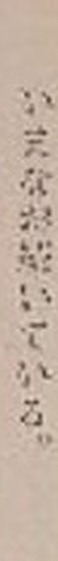いまなお続いている。
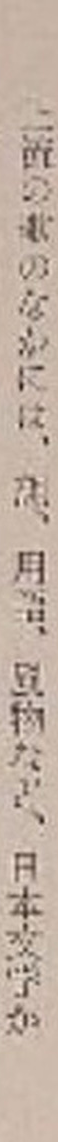の歌のなかには、、用語、風物など、日本文学か
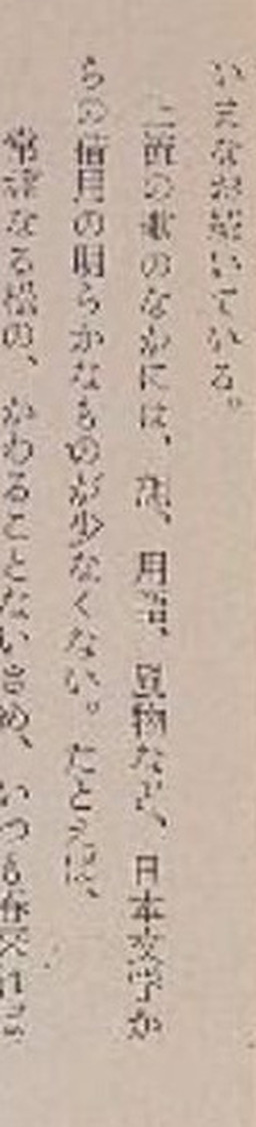の歌のなかには、、用語、風物など、日本文学か
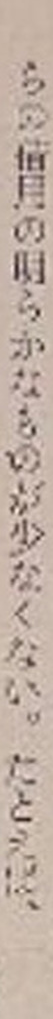らの借用の明らかなものが少なくない。たとえば、
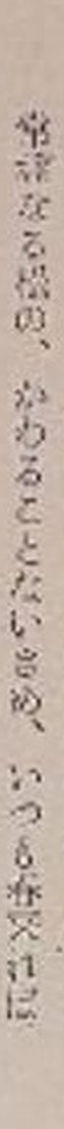常盤なる松の、かわることないさめ、いつも春来れば
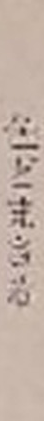色どまさる
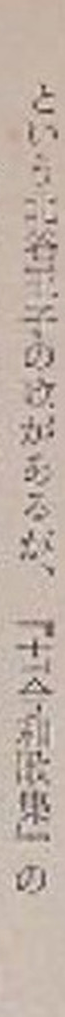という北谷王子の歌があるが、『古今和歌集』の
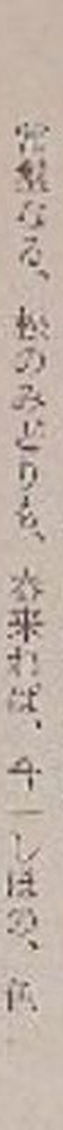常盤なる、松のみどりも、春来れば、今一しほの、色
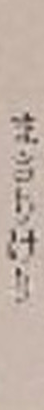まさりけり
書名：沖縄口承文芸
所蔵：University of the Ryukyus Library
